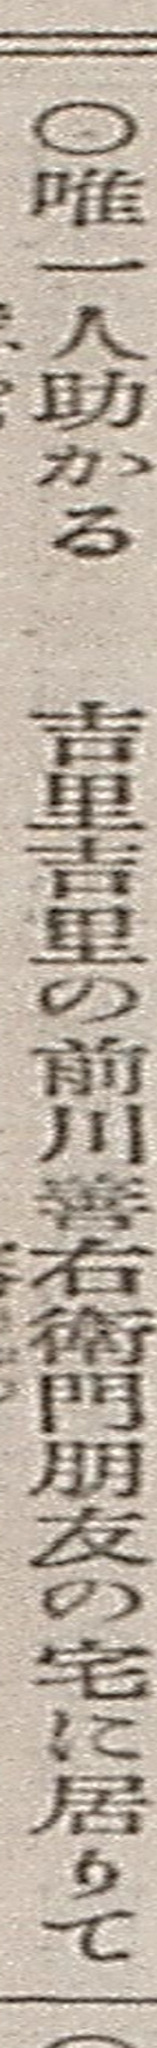○唯一人助かる吉里吉里の前川善右衛門朋友の宅に居りて
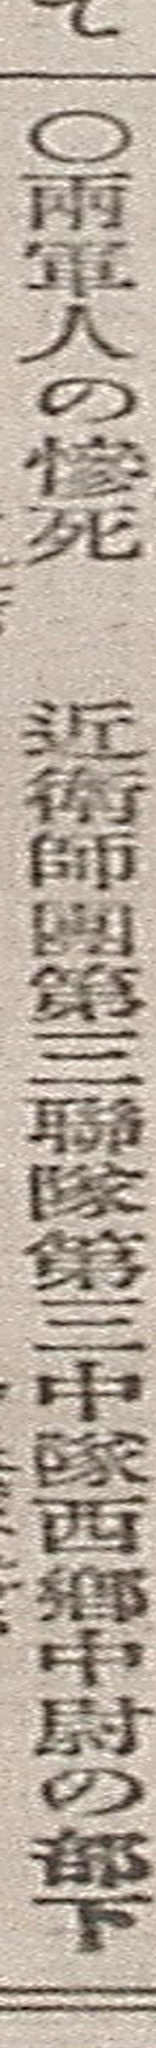○両軍人の惨死近衛師団第三連隊第三中隊西郷中尉の部下
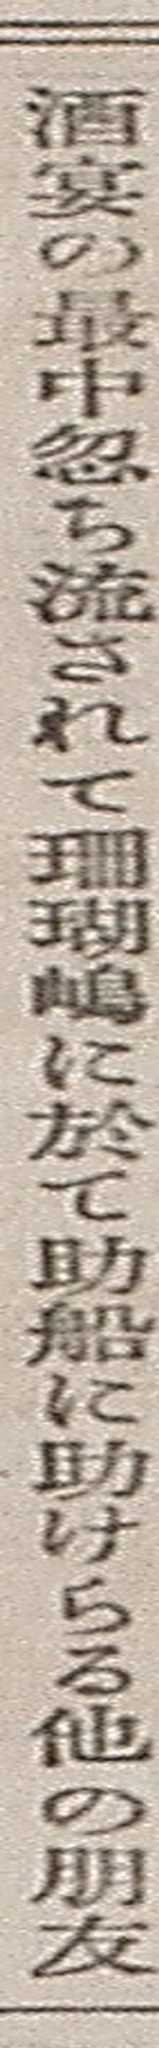酒宴の最中忽ち流されて珊瑚嶋に於て助船に助けらる他の朋友
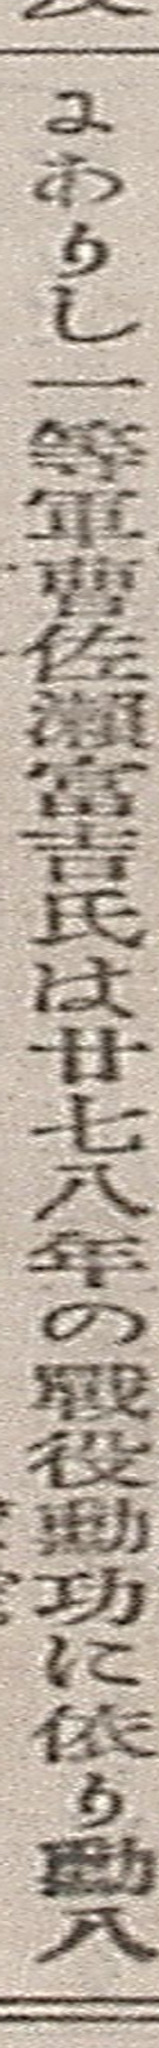にありし一等軍曹佐瀬冨吉氏は廿七八年の戦役勲功に依り勲八
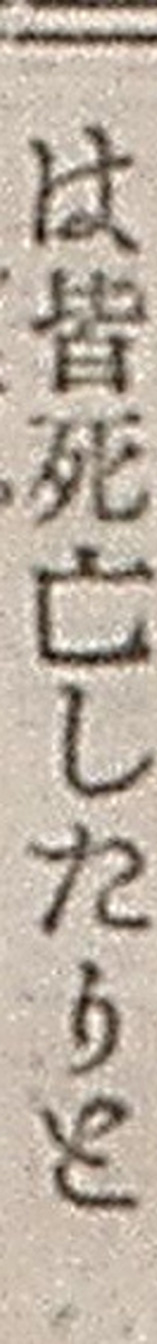は皆死亡したりと
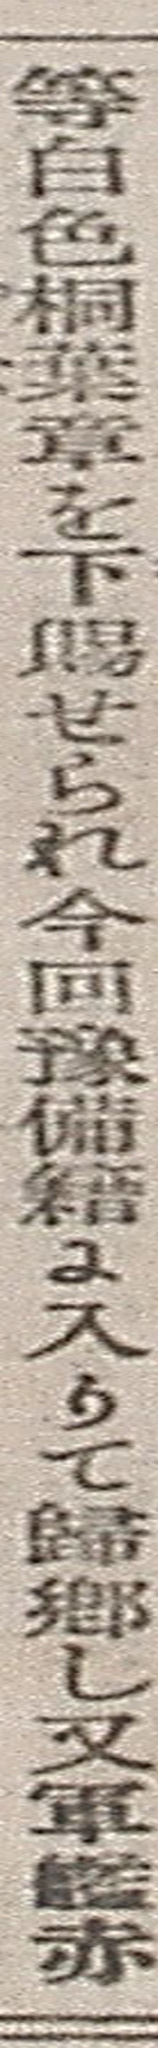等白色桐葉章を下賜せられ今回予備籍に入りて帰郷し又軍艦赤
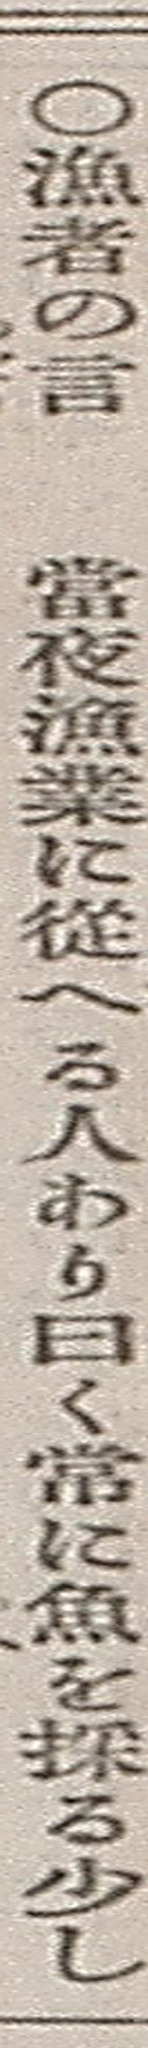○漁者の言当夜漁業に従へる人あり曰く常に魚を採る少し
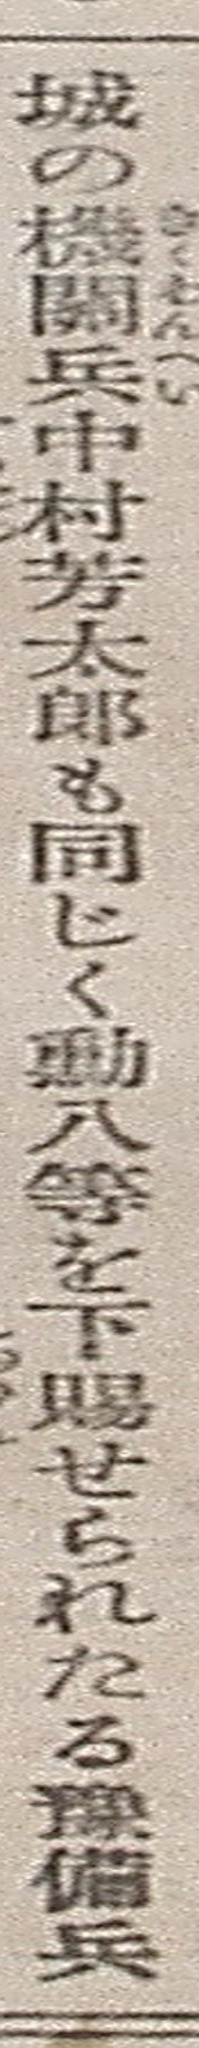城の機関兵中村芳太郎も同じく勲八等を下賜せられたる予備兵
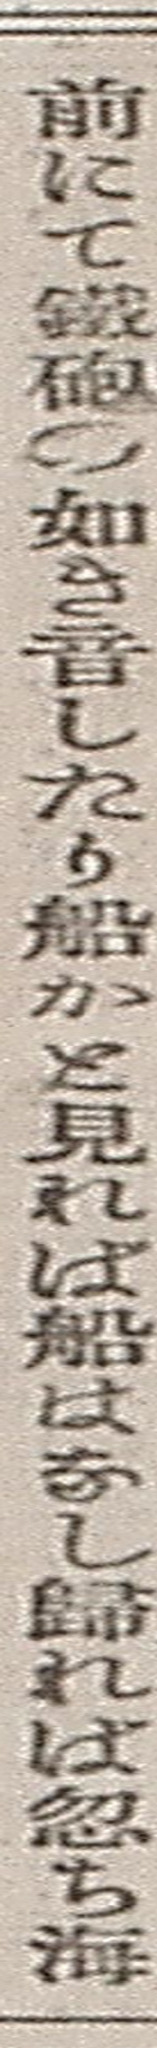前にて鉄砲の如き音したり船かと見れば船はなし帰れば忽ち海
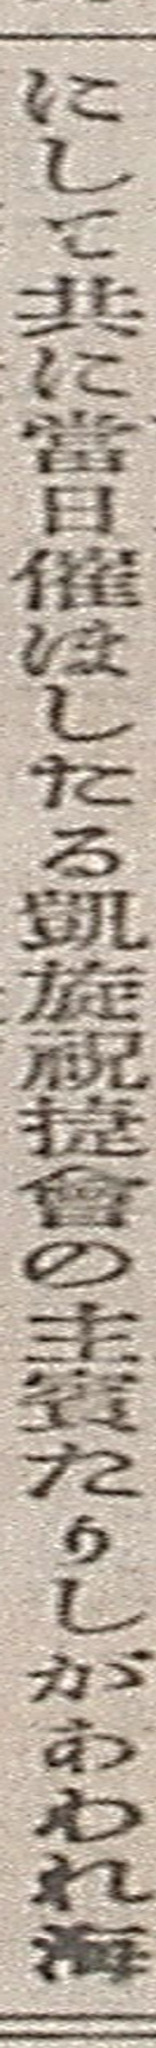にして共に当日催ほしたる凱旋祝捷会の主賓たりしがあわれ海
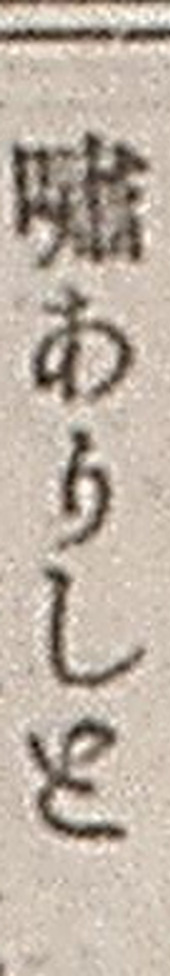嘯ありしと
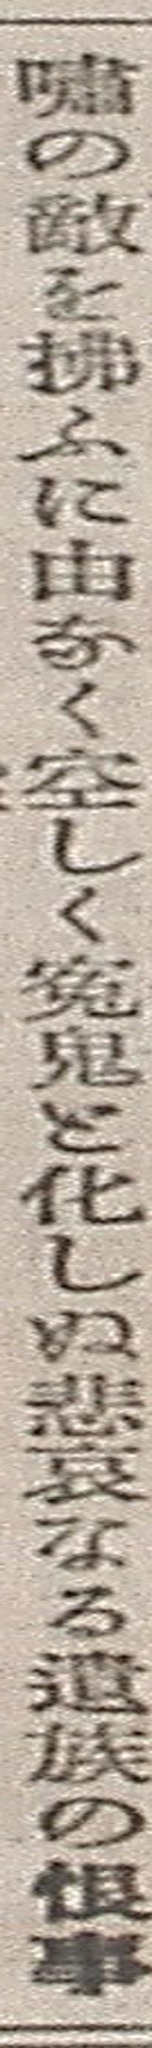嘯の敵を払ふに由なく空しく冤鬼と化しぬ悲哀なる遺族の恨事
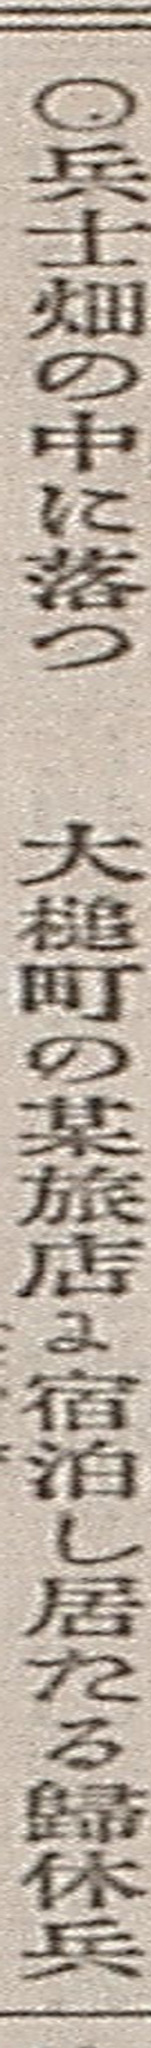○兵士畑の中に落つ大槌町の某旅店に宿泊し居たる帰休兵
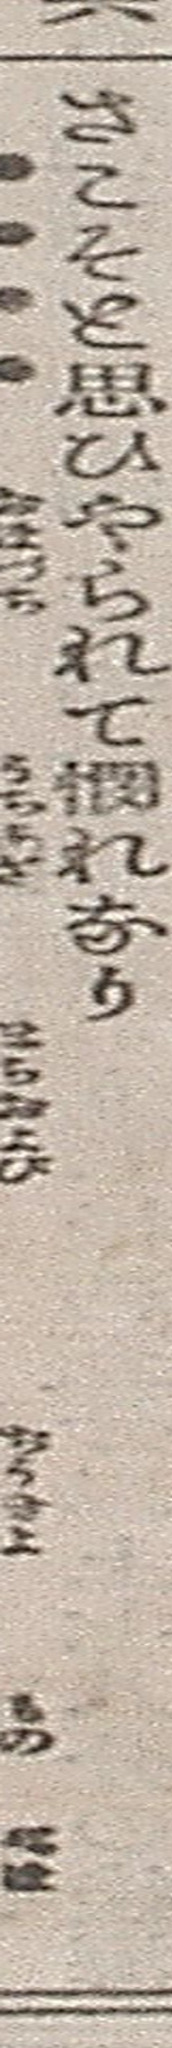さこそと思ひやられて憫れなり
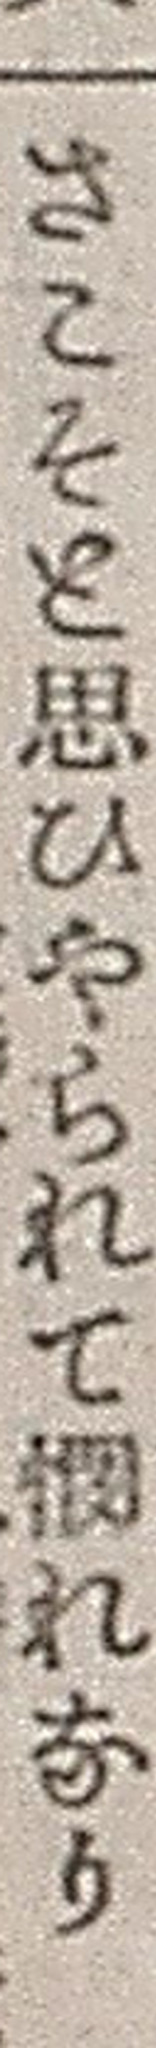さこそと思ひやられて憫れなり
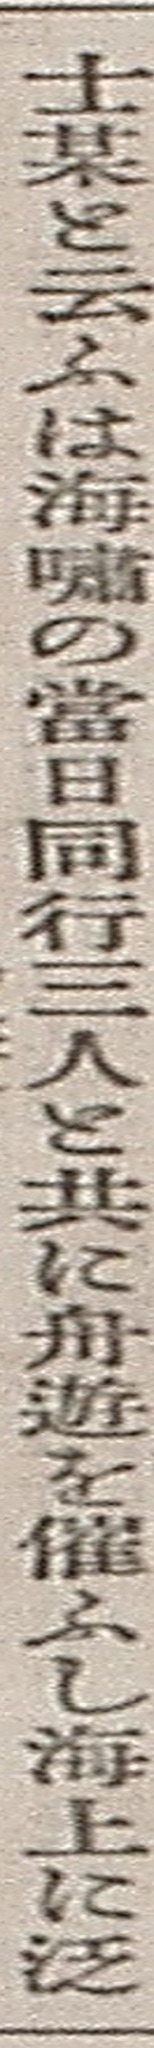士某と云ふは海嘯の当日同行三人と共に舟遊を催ふし海上に泛
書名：風俗畫報臨時増刊第百十九號　大海嘯被害録（中）
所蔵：東京大学地震研究所図書室 Earthquake Research Institute Library, The University of Tokyo, JAPAN
